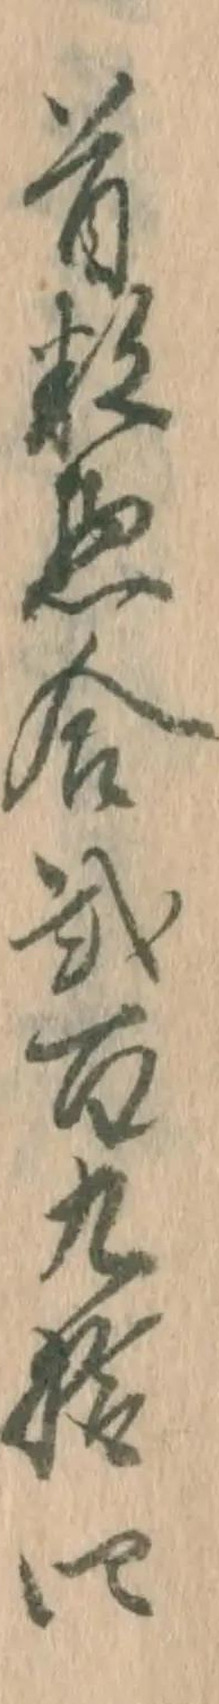首数惣合弐百九拾四
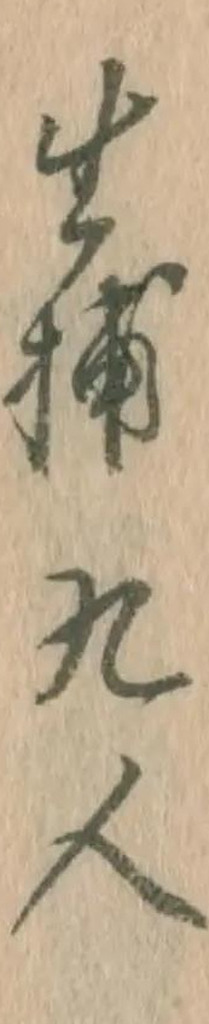生捕九人
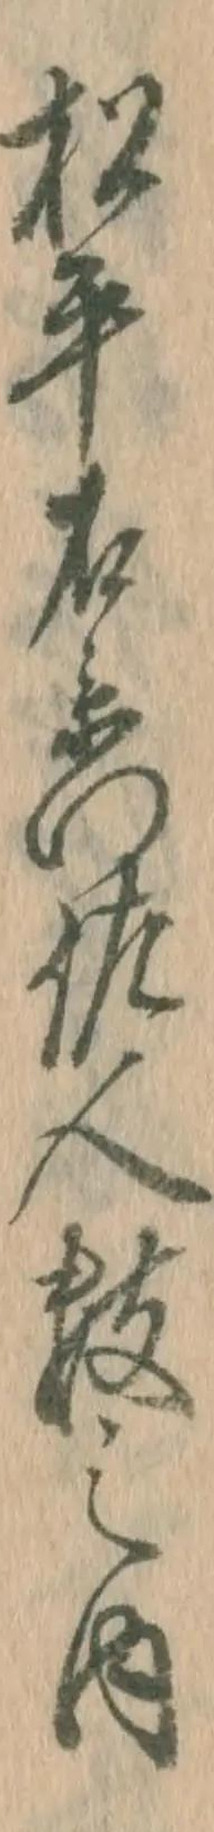松平右衛門佐人数之内
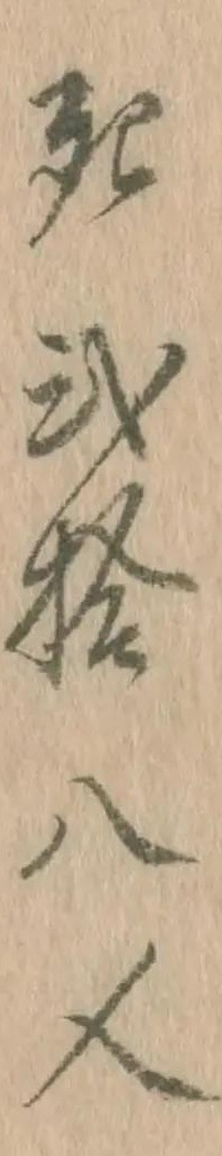死弐拾八人
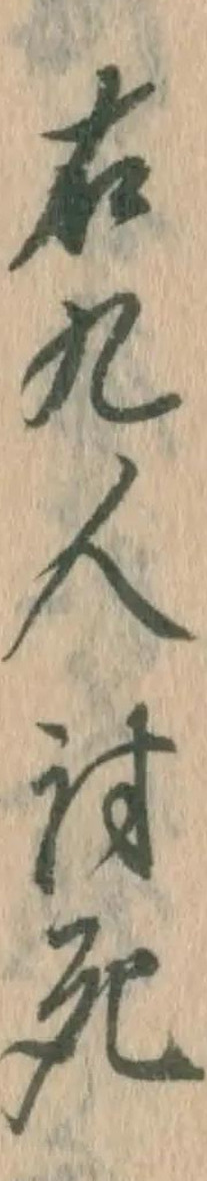右九人討死

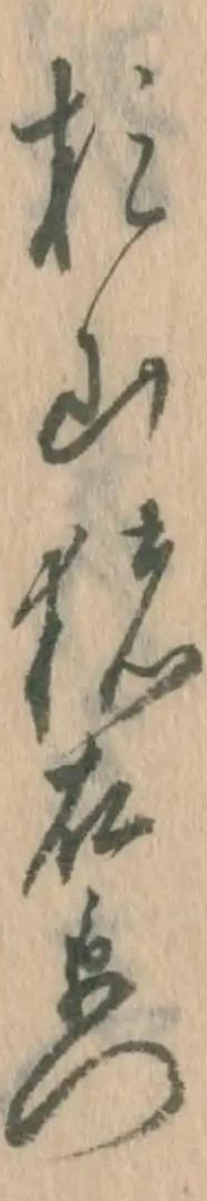杉山猪右衛門
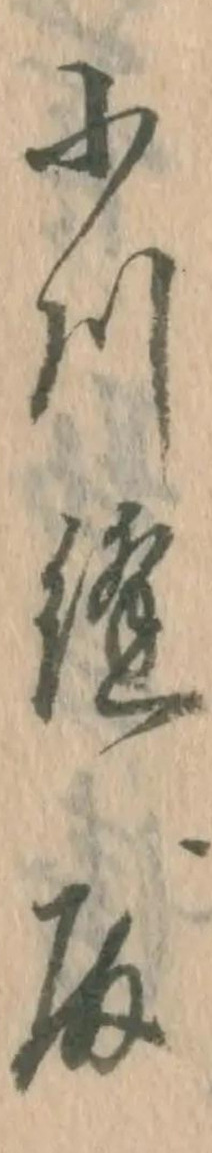小川縫殿
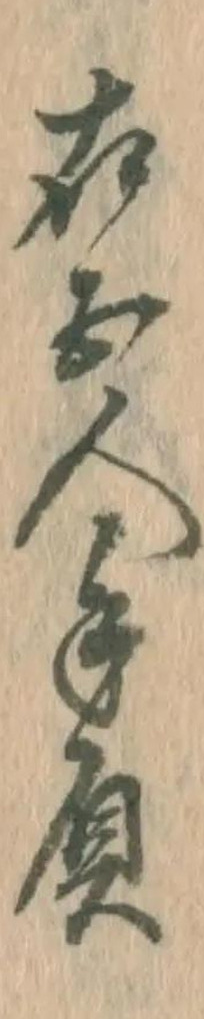右五人手負
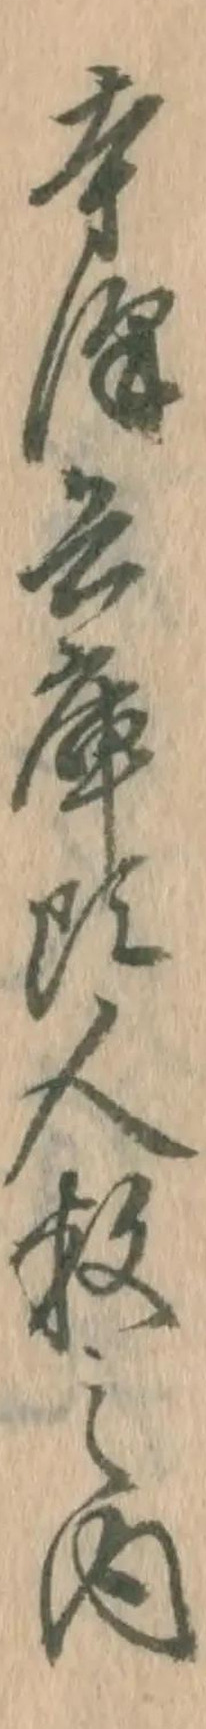寺沢兵庫頭人数之内
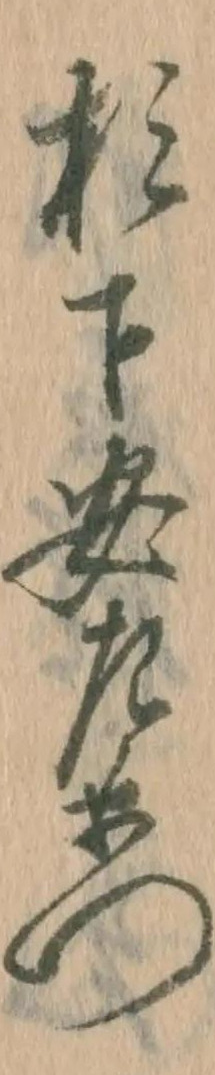同杉下安左衛門
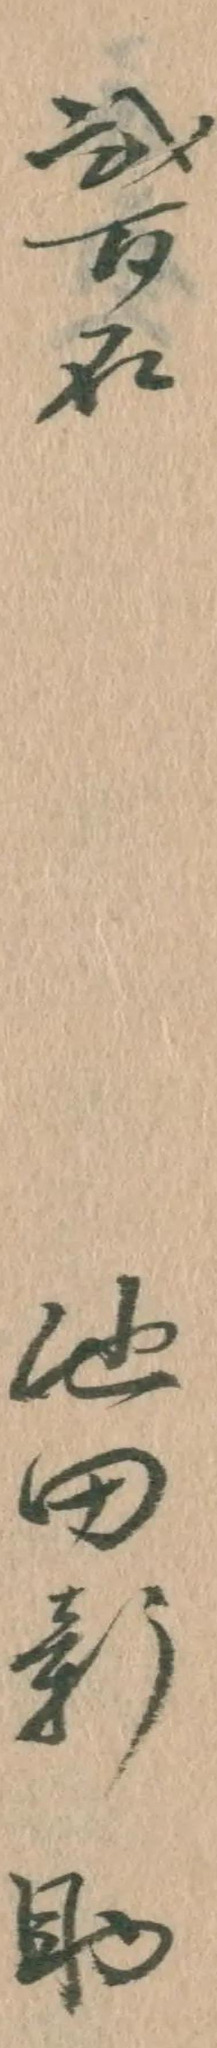弐百石池田新助
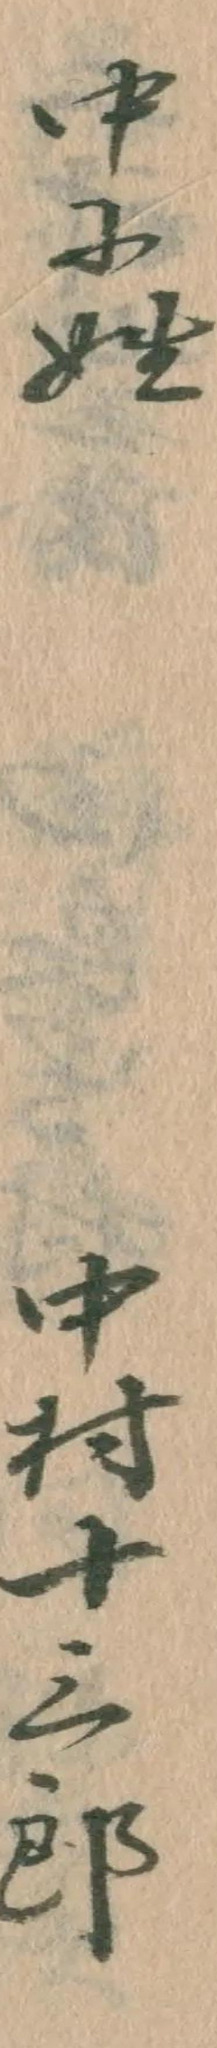中小姓中村十三郎
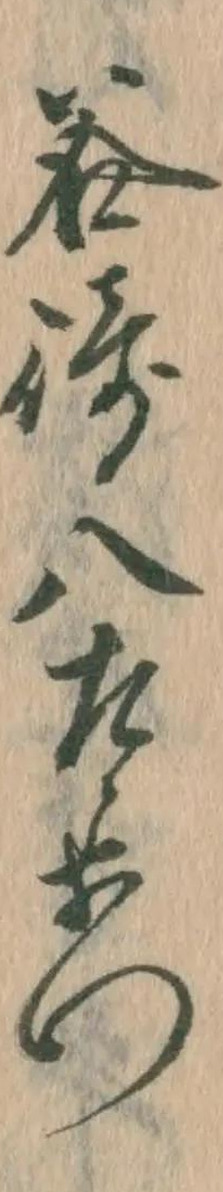同谷崎八左衛門
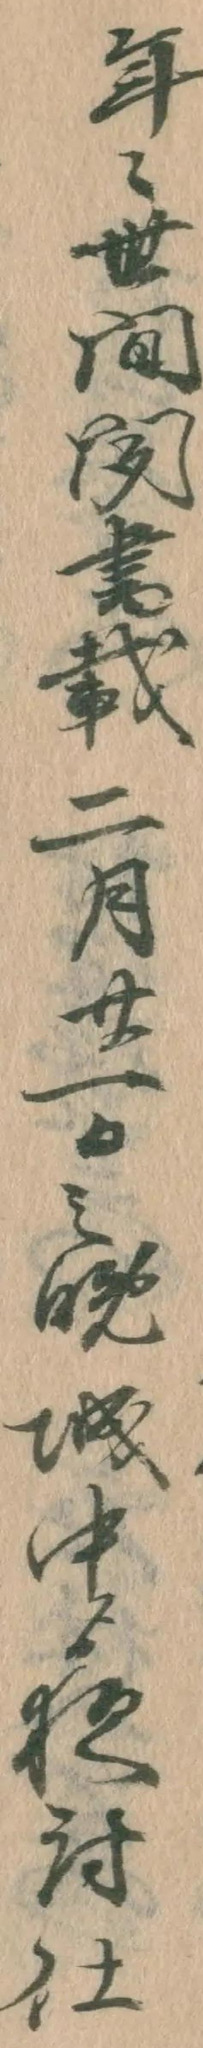年之世間聞書載二月廿一日之晩城中ゟ夜討仕

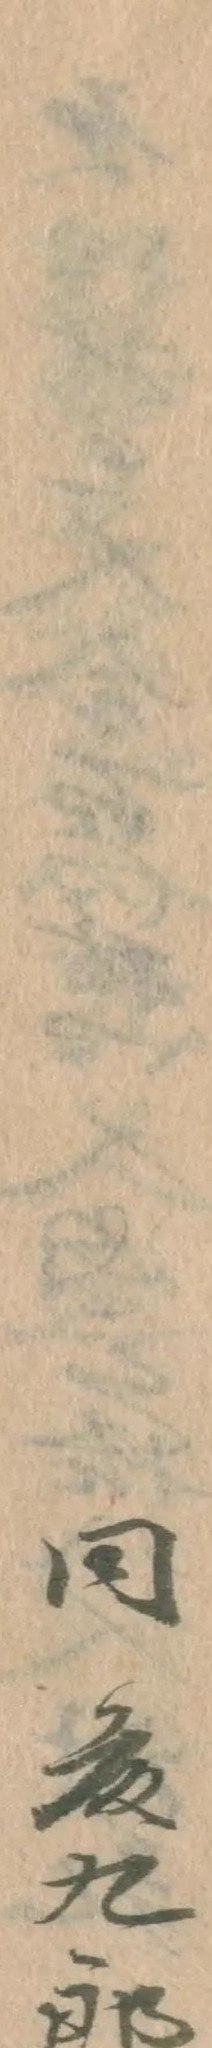同藤九郎
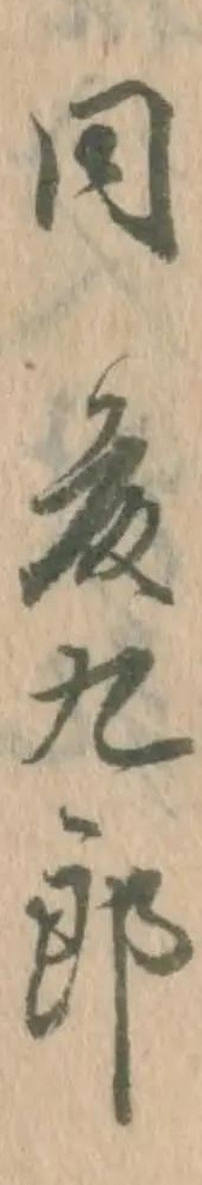同藤九郎
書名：切支丹御退治記 49巻. [7]
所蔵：国立国会図書館 National Diet Library, JAPAN
